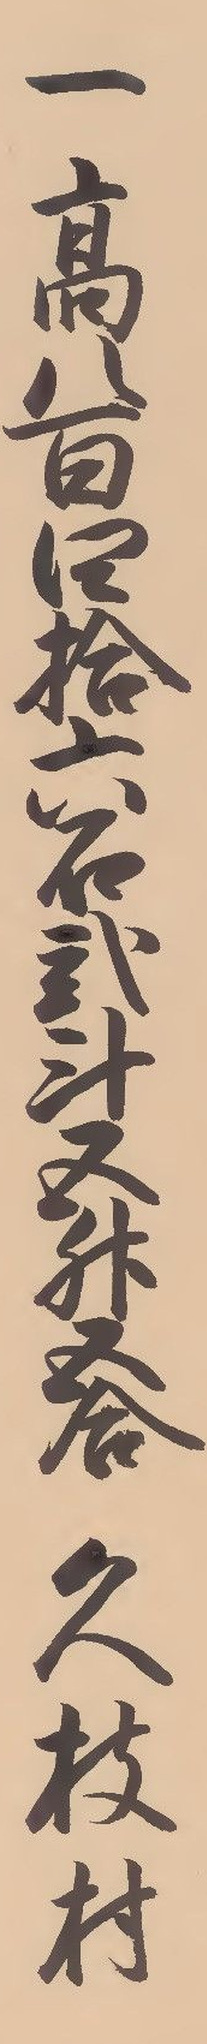一髙八百四拾六石弐斗五升五合久枝村
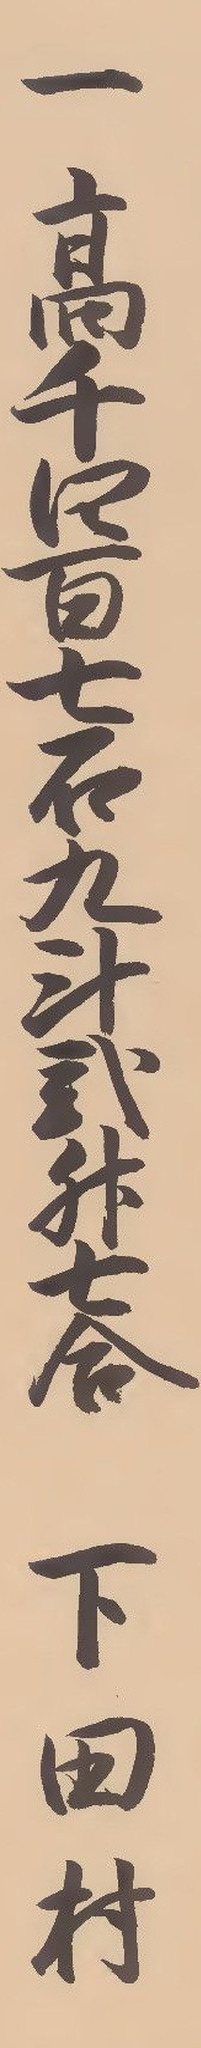一髙千四百七石九斗弐升七合下田村

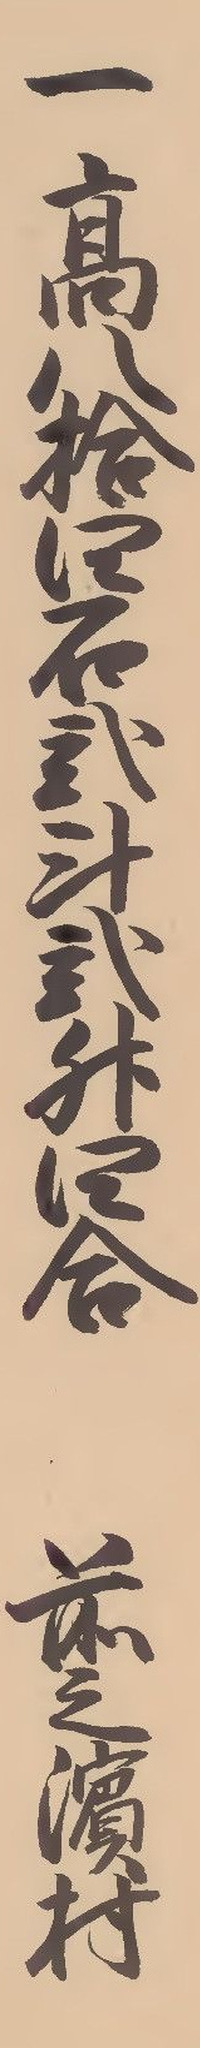一髙八拾四石弐斗弐升四合前之濱村
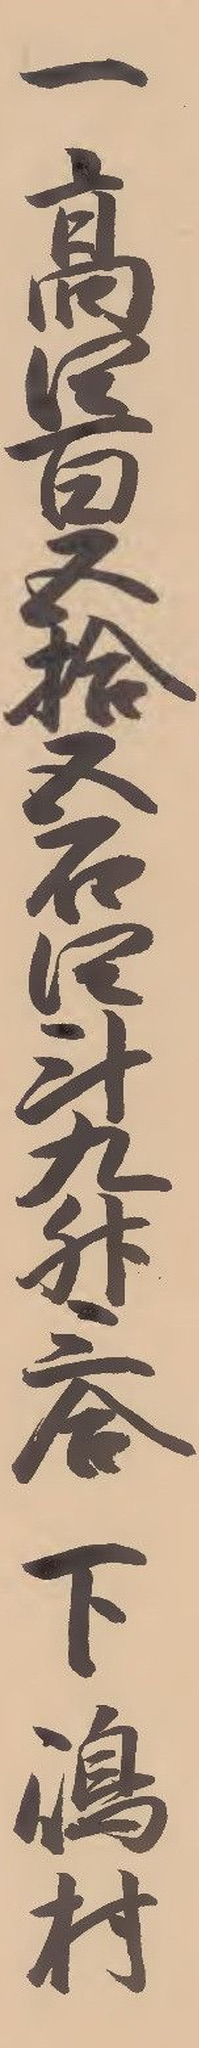一髙四百五拾五石四斗九升三合下嶋村
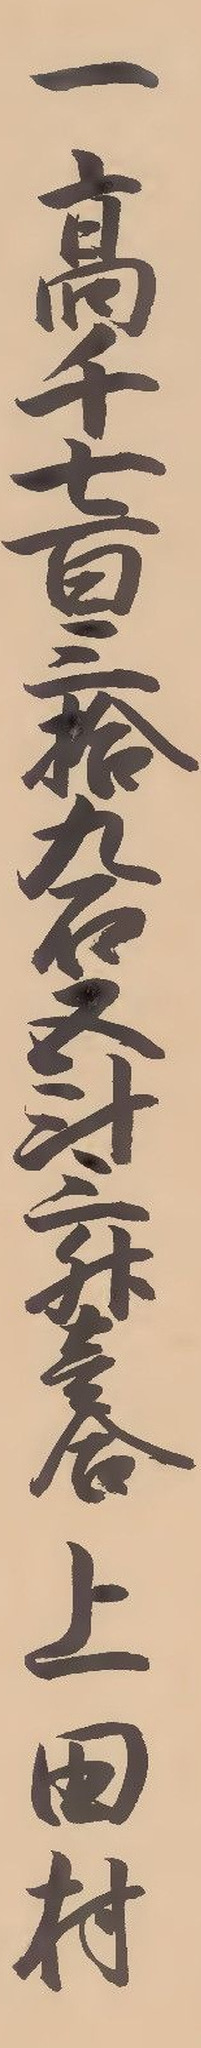一髙千七百三拾九石五斗三升壱合上田村
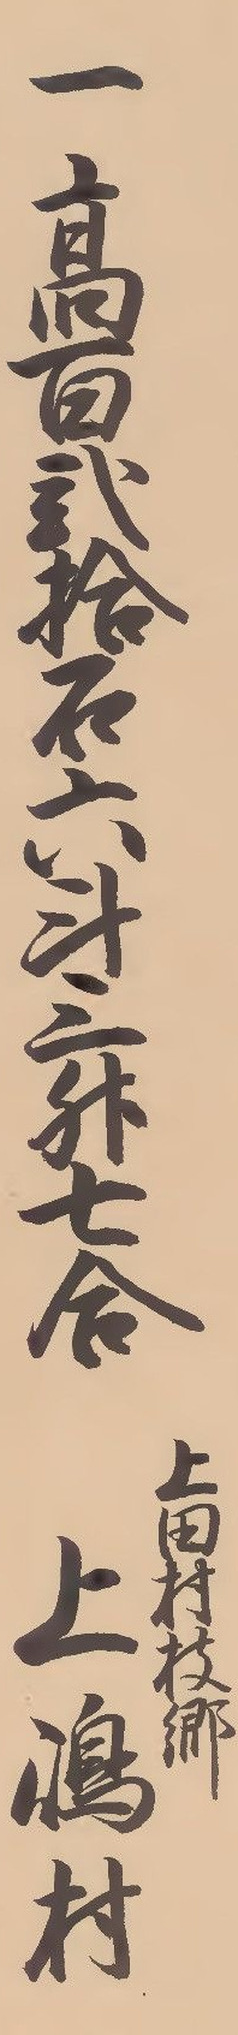一髙百弐拾石六斗三升七合上嶋村
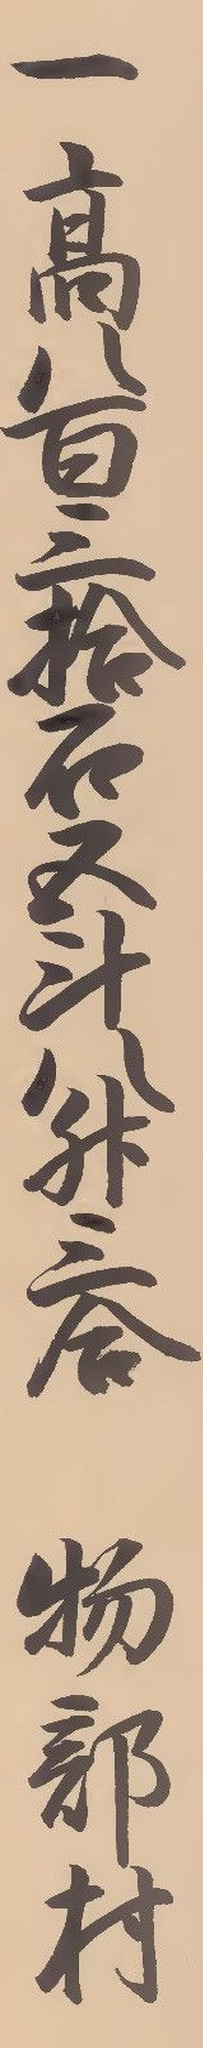一髙八百三拾石五斗八升三合物部村
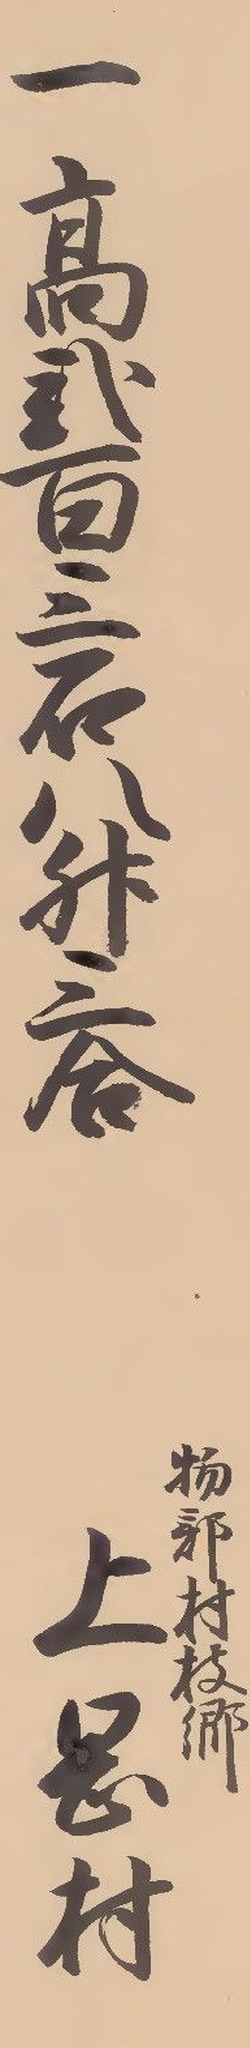一髙弐百三石八升三合上岡村
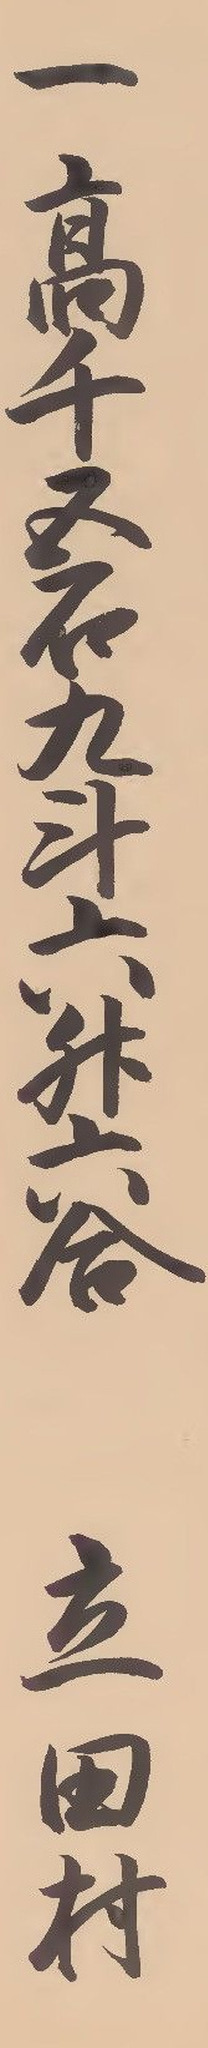一髙千五石九斗六升六合立田村
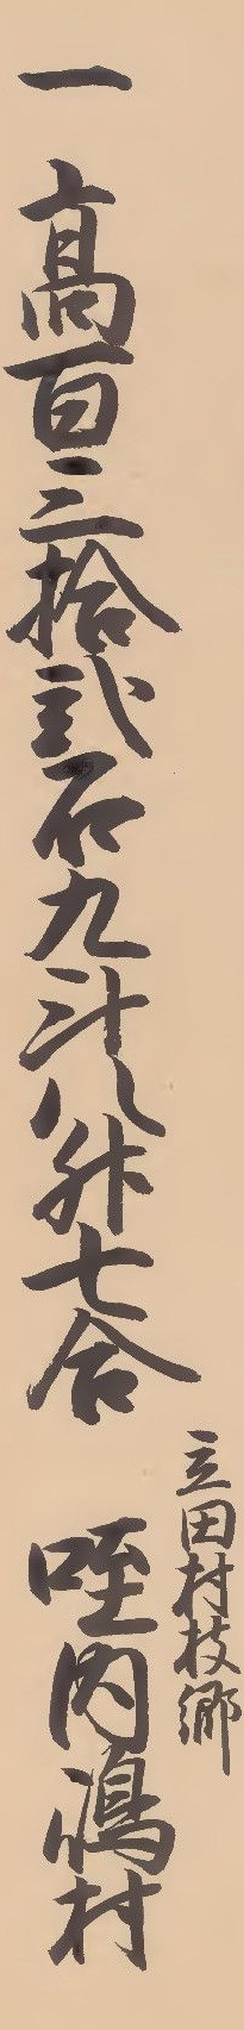一髙百三拾弐石九斗八升七合咥内嶋村

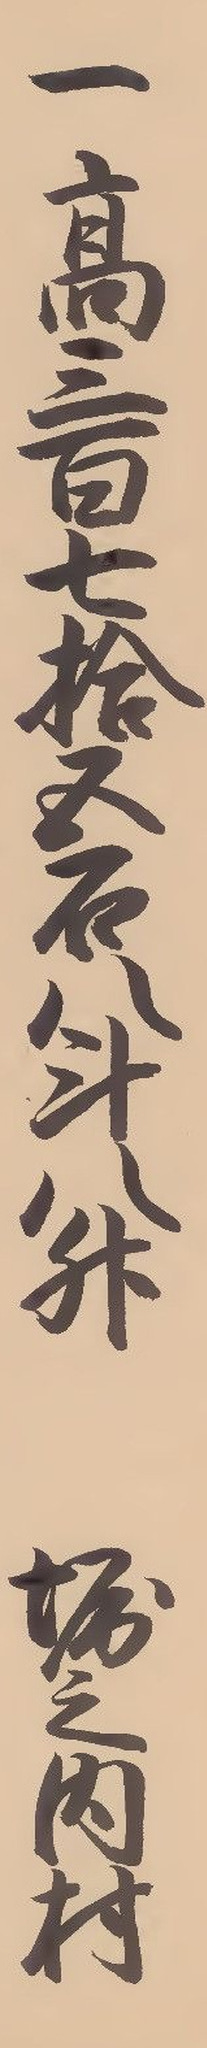一髙三百七拾五石八斗八升堀之内村
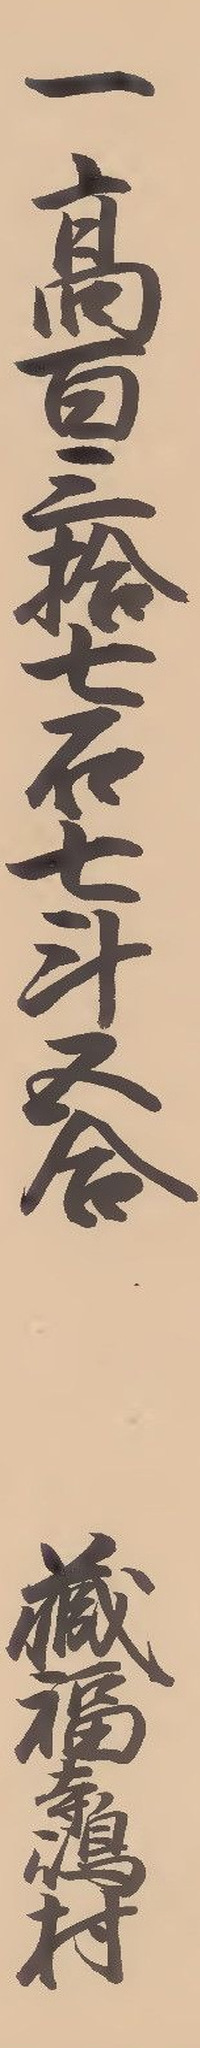一髙百三拾七石七斗五合藏福寺嶋村
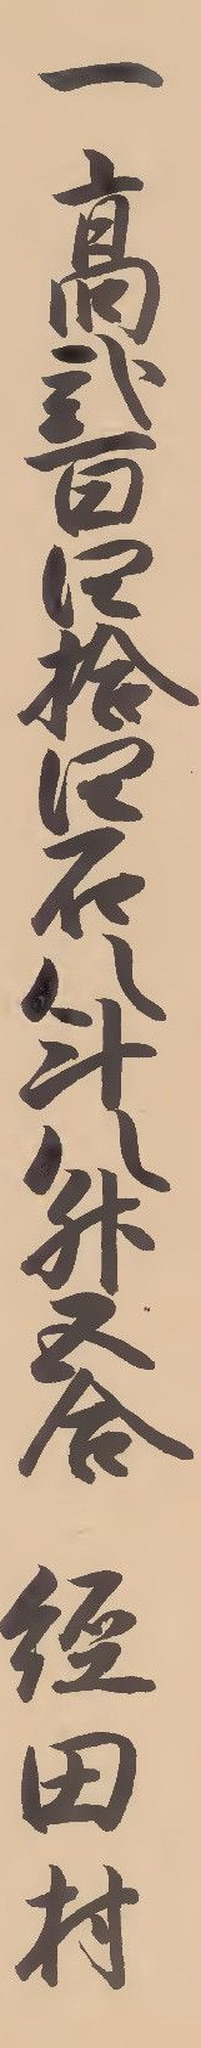一髙弐百四拾四石八斗八升五合経田村
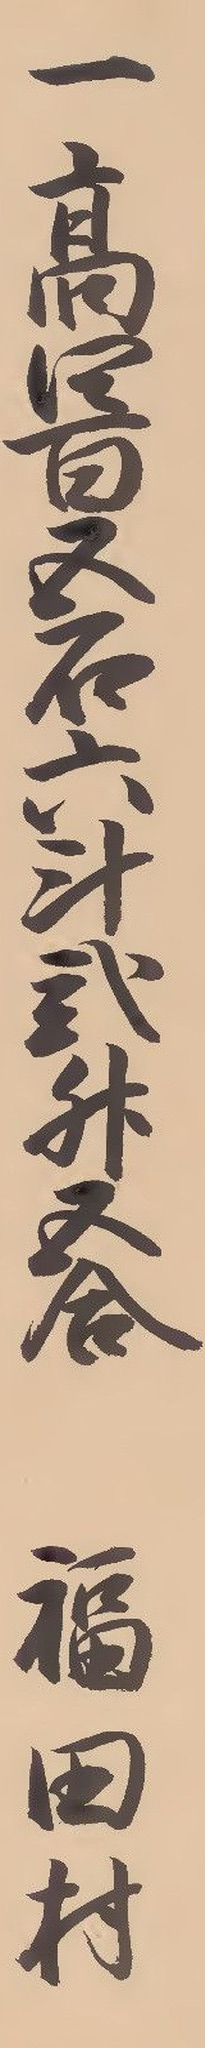一髙四百五石六斗弐升五合福田村
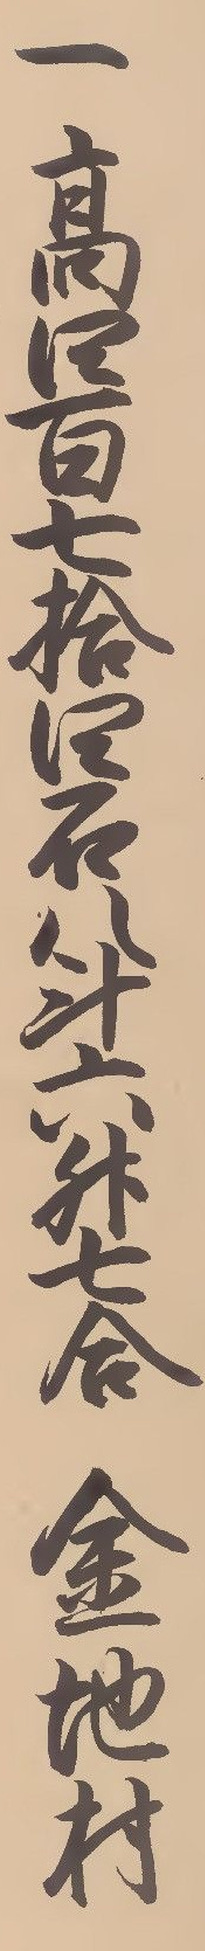一髙四百七拾四石八斗六升七合金地村
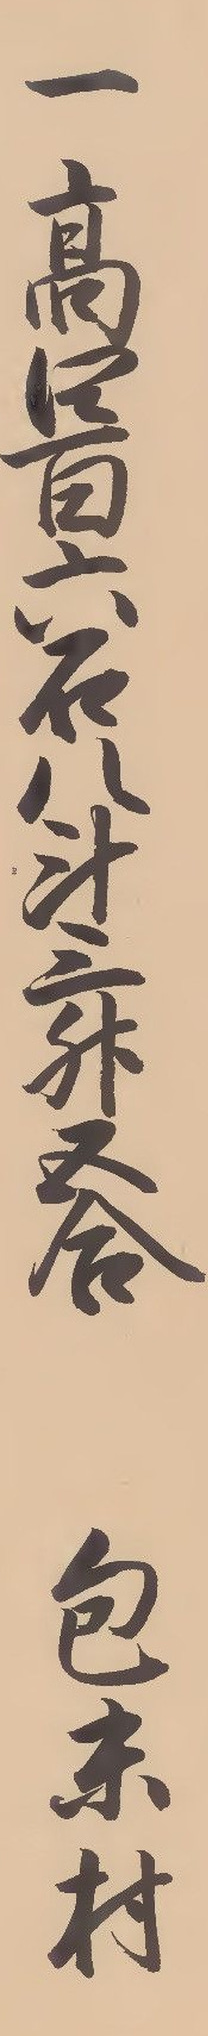一髙四百六石八斗三升五合包末村
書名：土佐国郷帳
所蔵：国立公文書館 National Archives of Japan
